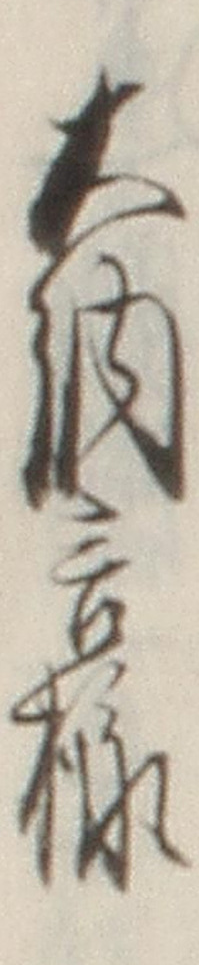大納言様
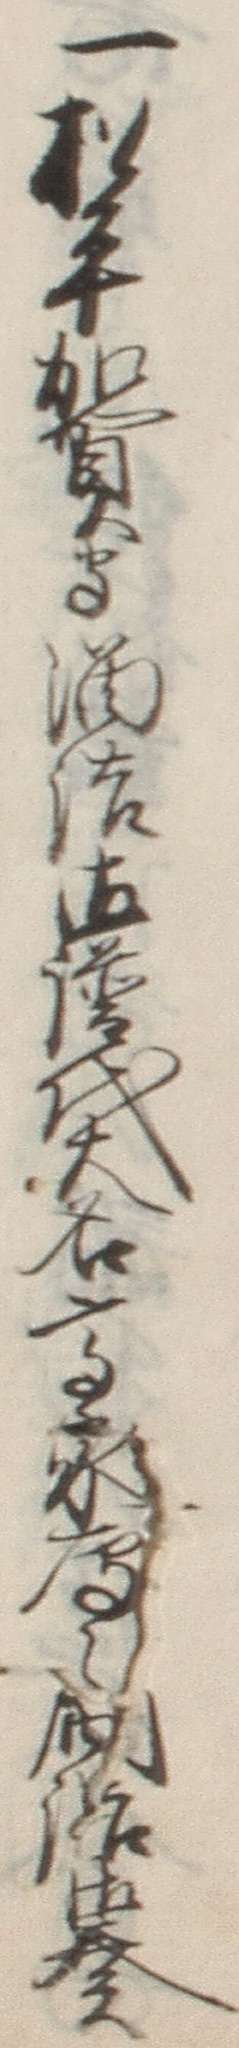一松平加賀守溜詰御譜代大名高家席之間詰御奏

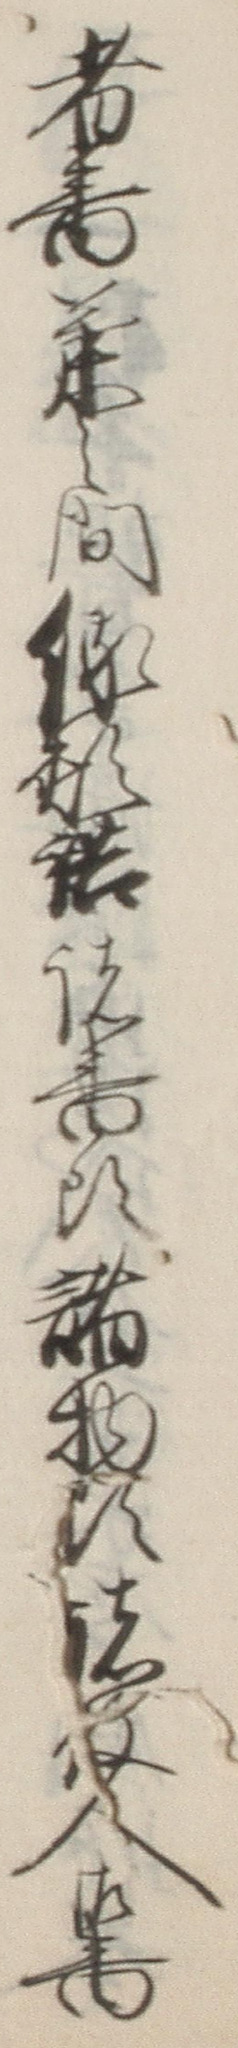者番菊之間縁類詰諸番頭諸物頭詰役人御番
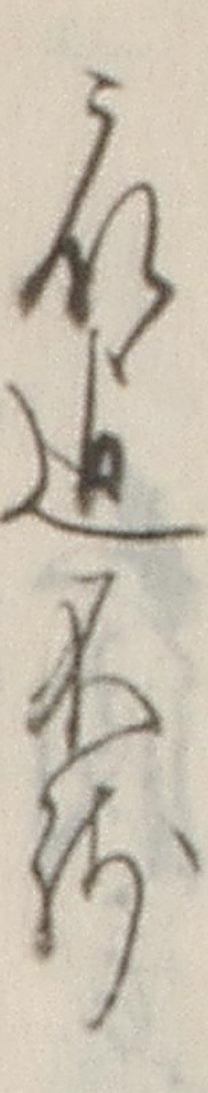衆迄不残
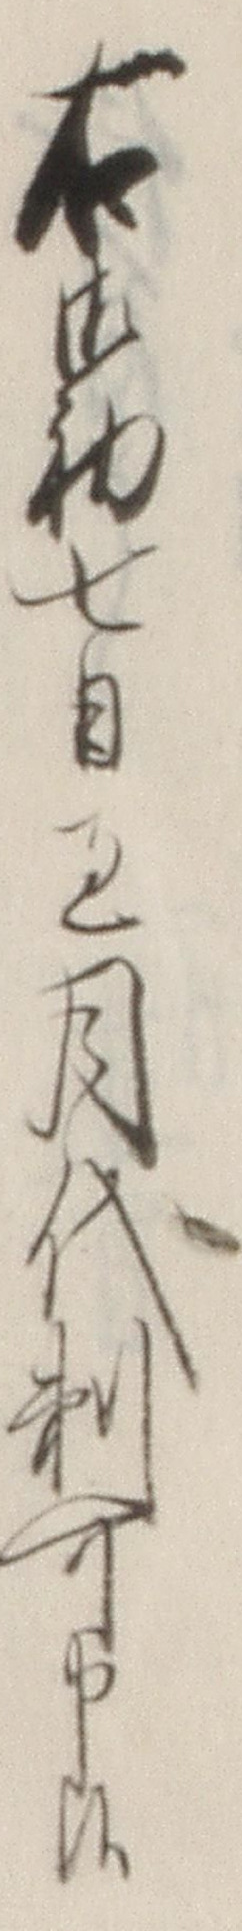右御初七日過月代剃可申候
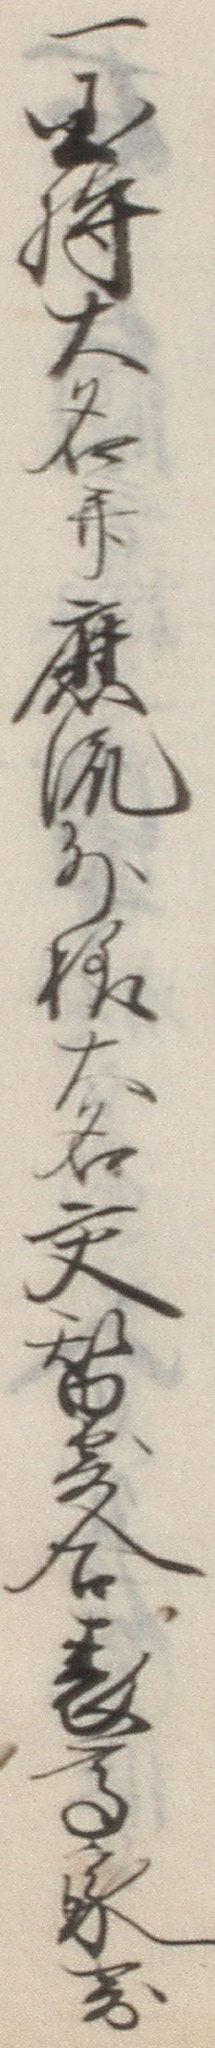一国持大名幷庶流外様大名交替寄合表高家寄
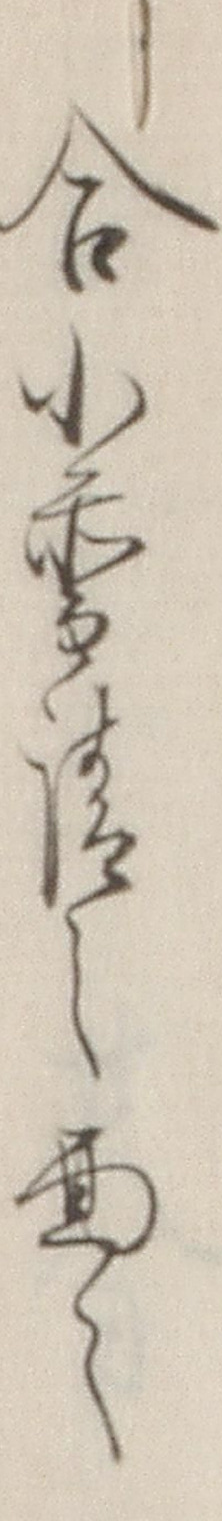合小普請之面々
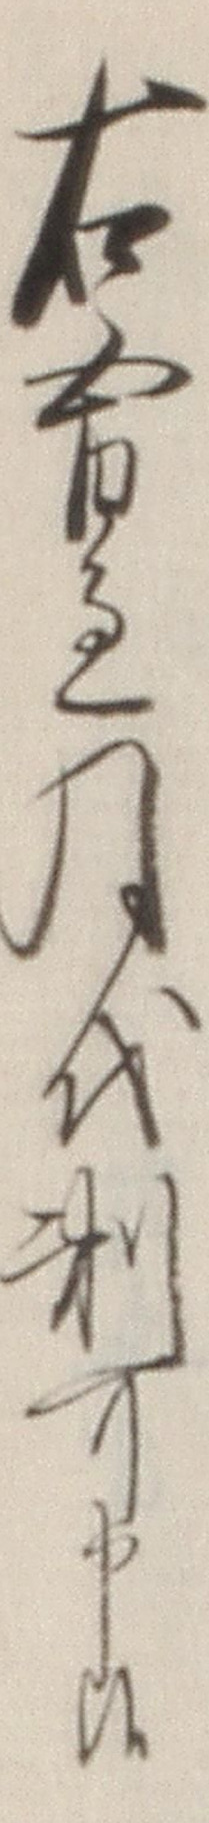右五日過月代剃可申候
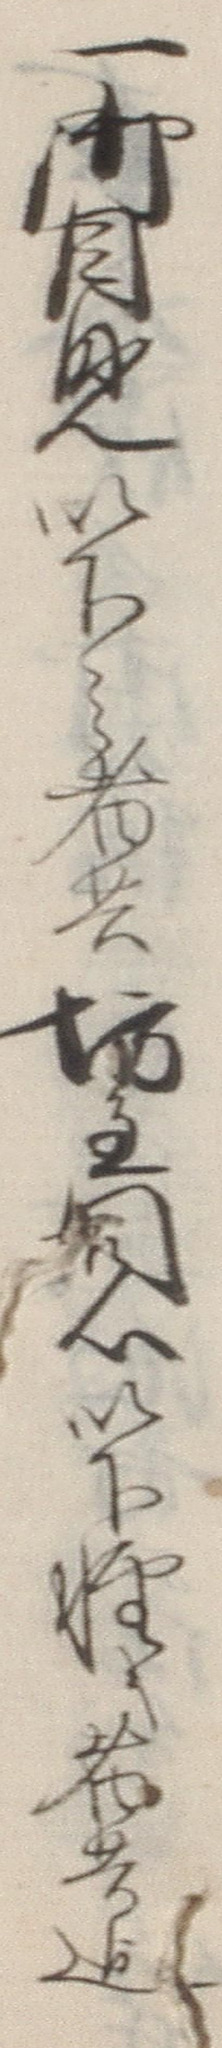一御目見以下之者共坊主同心以下軽キ者迄
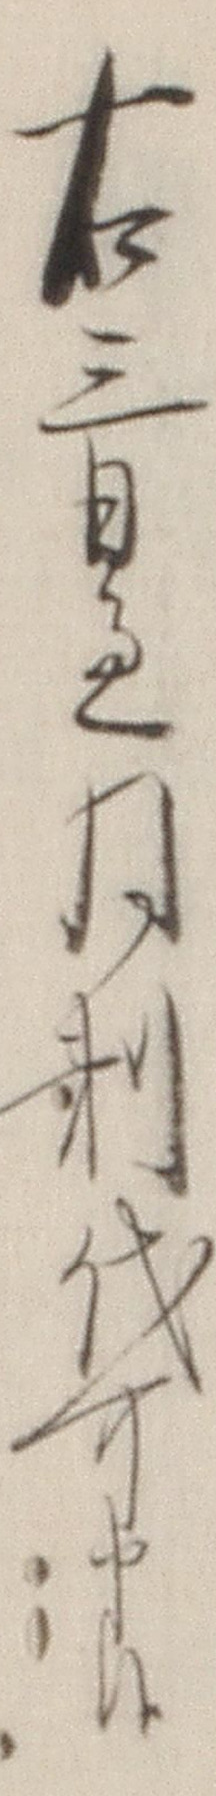右三日過同剃伐可申候
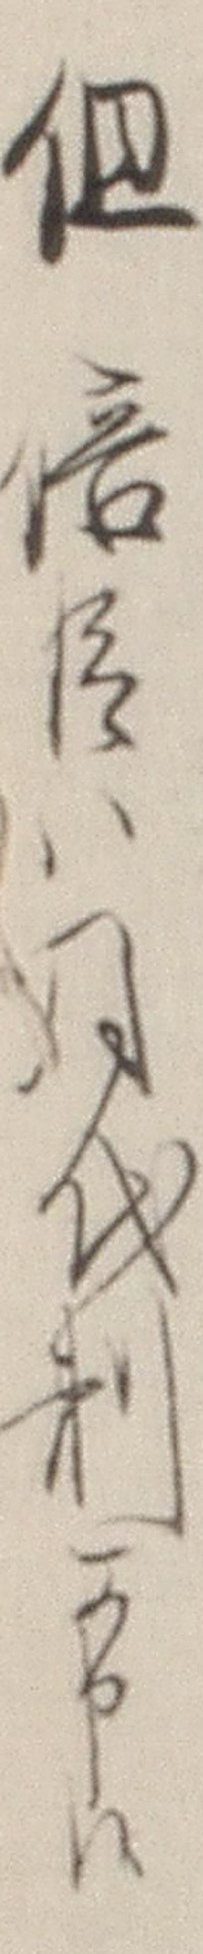但陪臣ハ同剃伐可申候
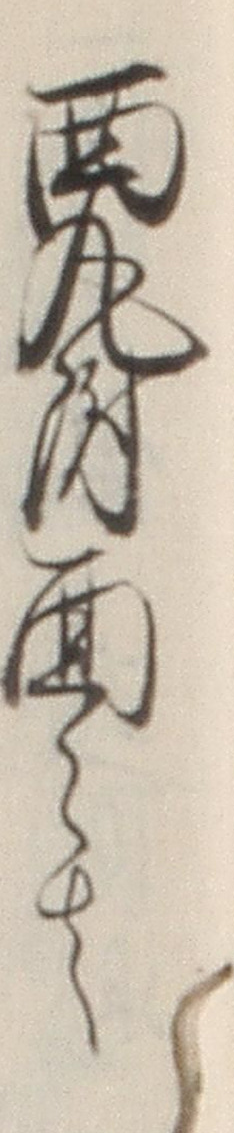西丸附面々は
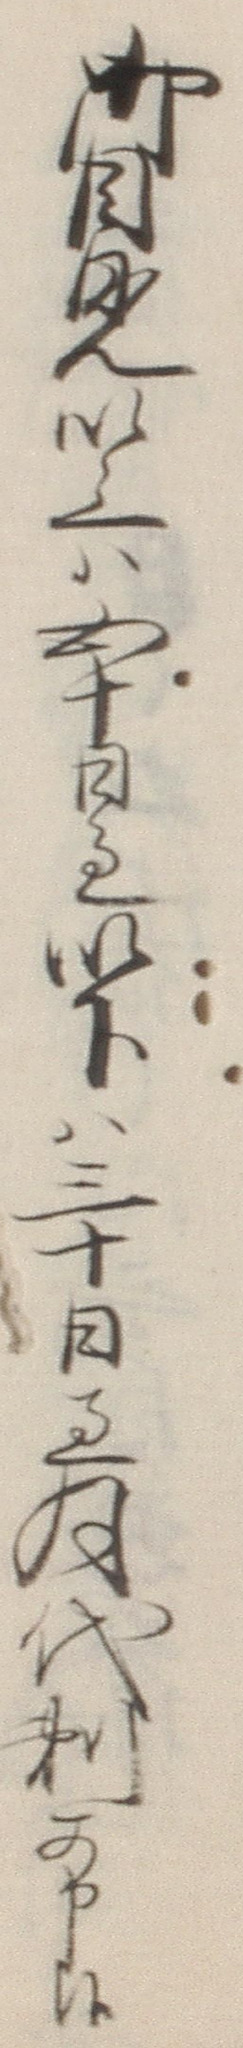御目見以上ハ五十日過以下ハ三十日過月代剃可申候
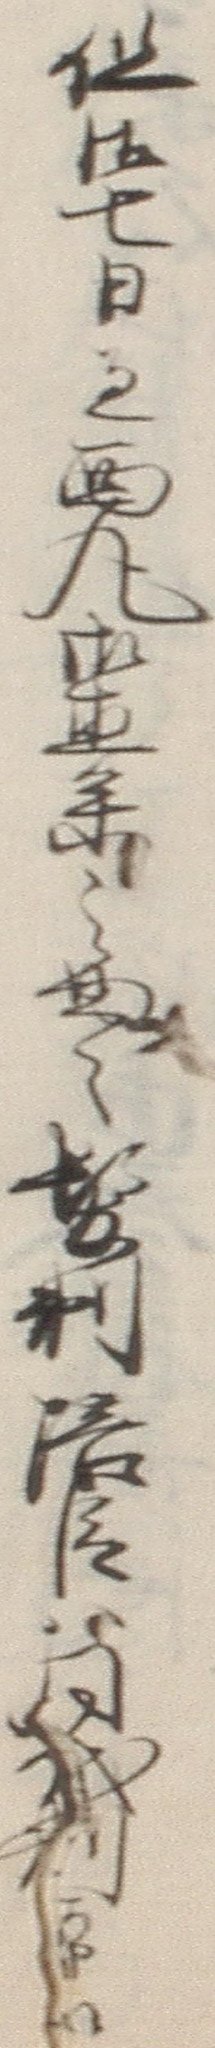但御七日過西丸御直参之面々髪剃陪臣ハ同髪剃可申候
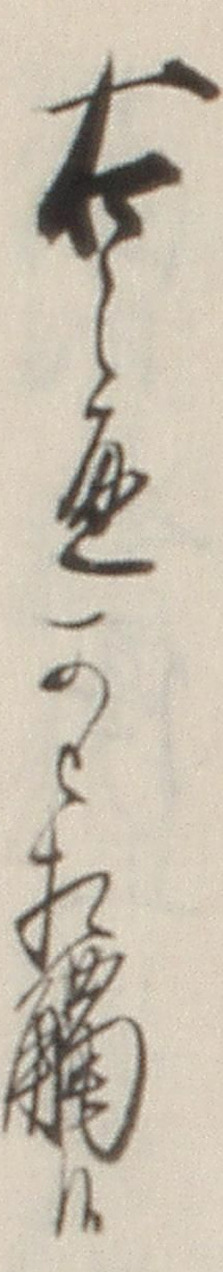右之通可被相触候
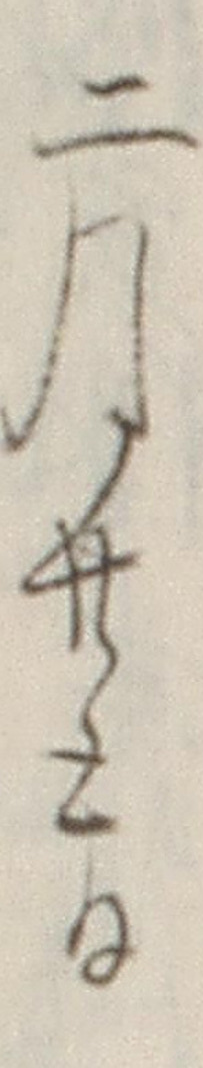二月廿五日
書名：[諸国災害記録]
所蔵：東京大学地震研究所図書室 Earthquake Research Institute Library, The University of Tokyo, JAPAN
